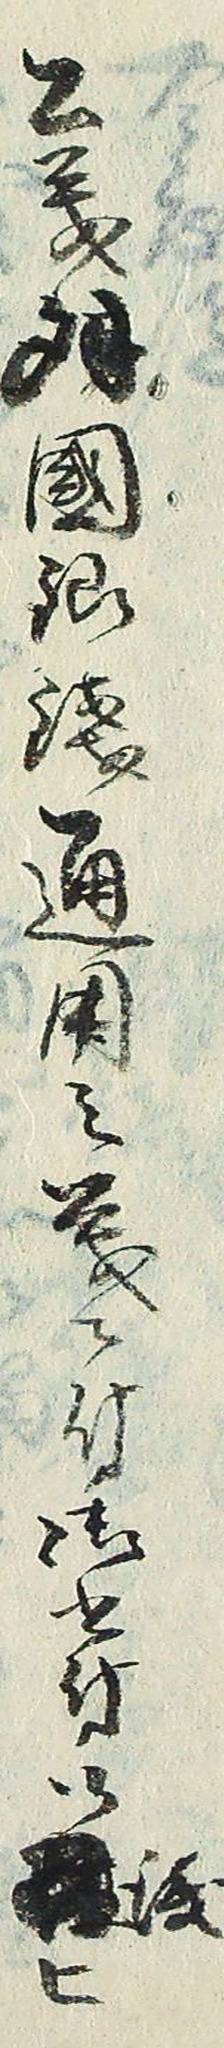公義外国銀銭通用之義に付御書付御渡被
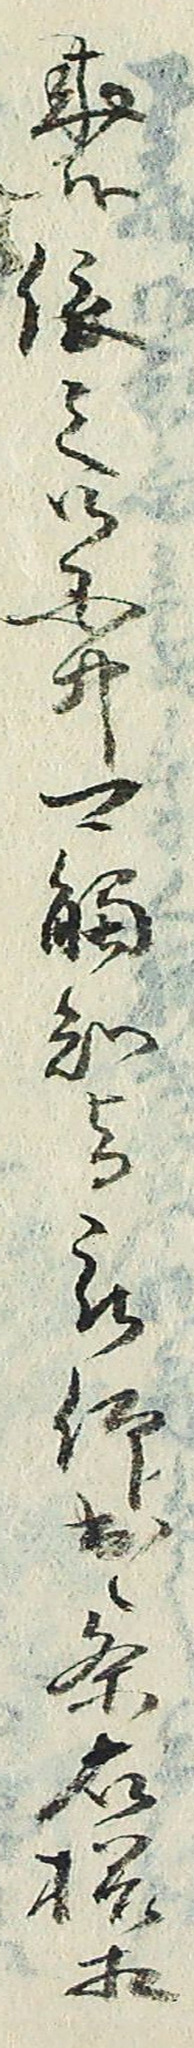成候依之御国中可触知旨被仰出候条右様相
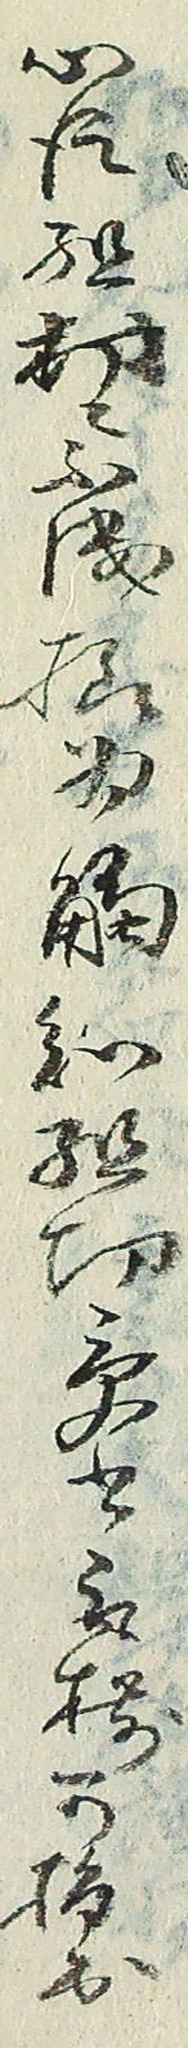心得組村々不洩様為触知組切受書取揃可指出
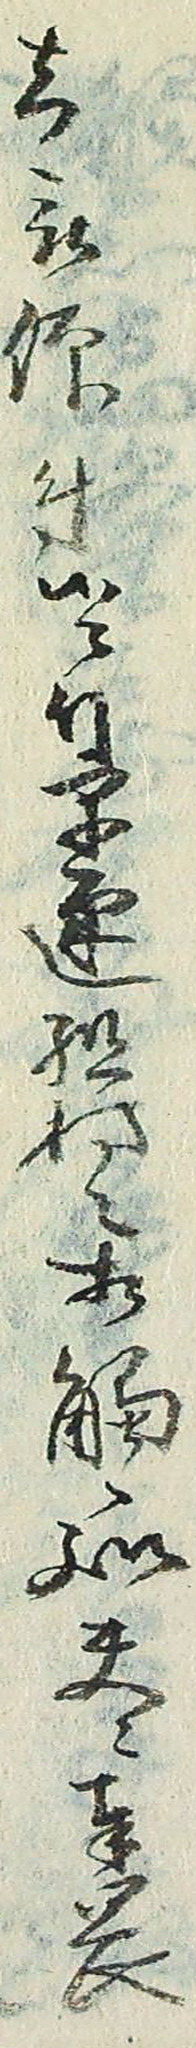旨被仰付候に付早速組村々相触候処夫々奉畏
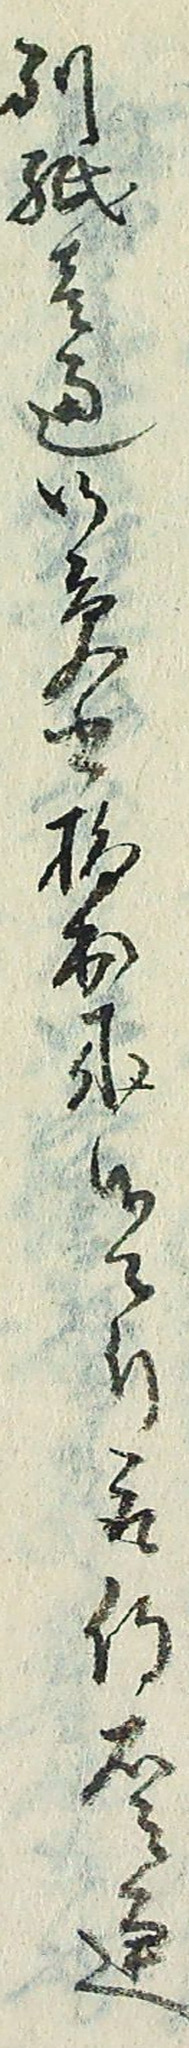別紙之通御受書指出来候に付取都右之通
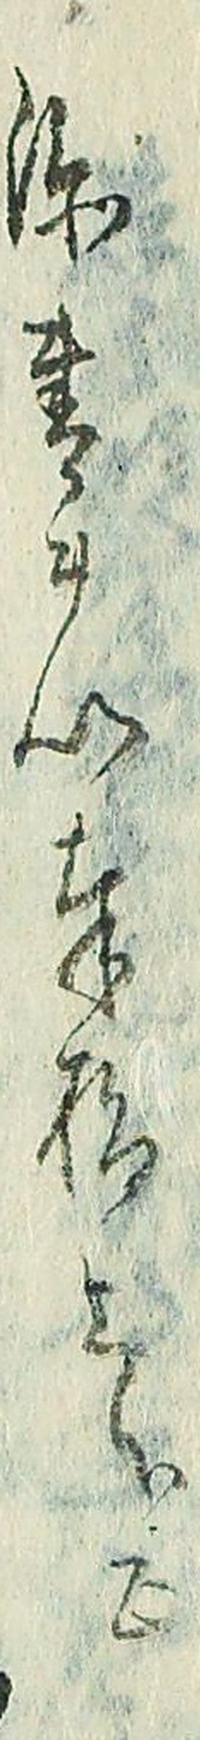添書を以奉指上候以上
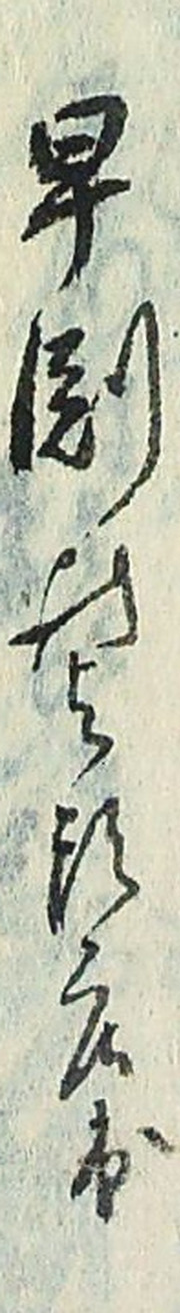早渕村与頭庄屋
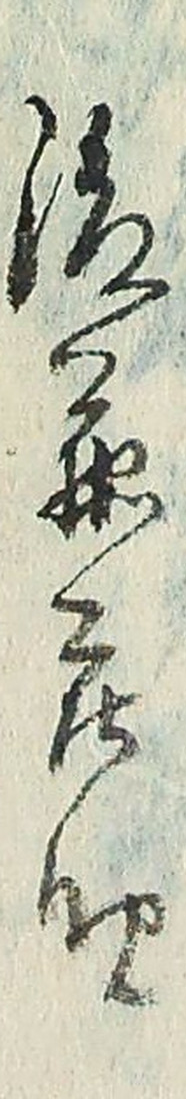後藤庄助
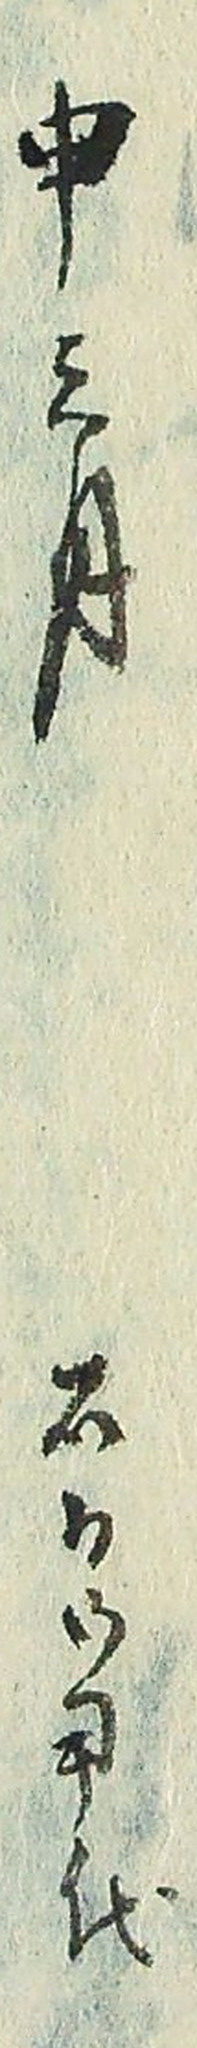申三月右同御用代
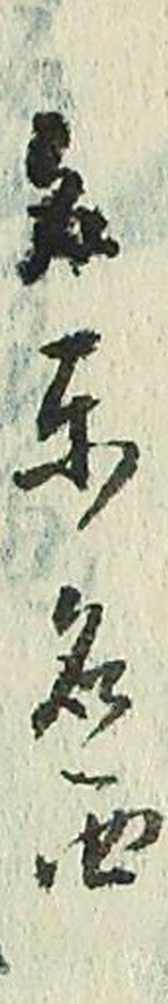名東名西
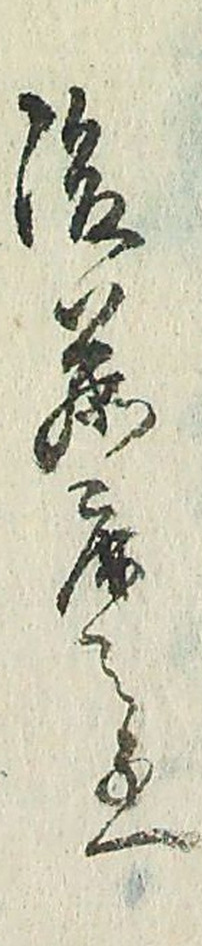後藤麻之丞
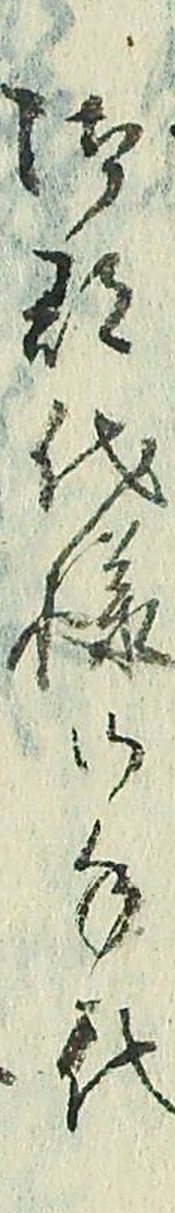御郡代様御手代
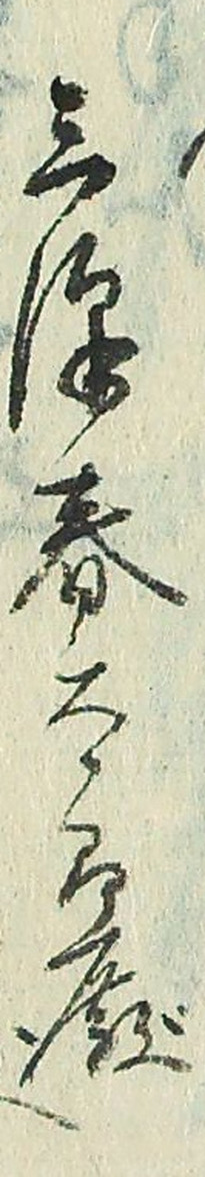三沢春太郎殿
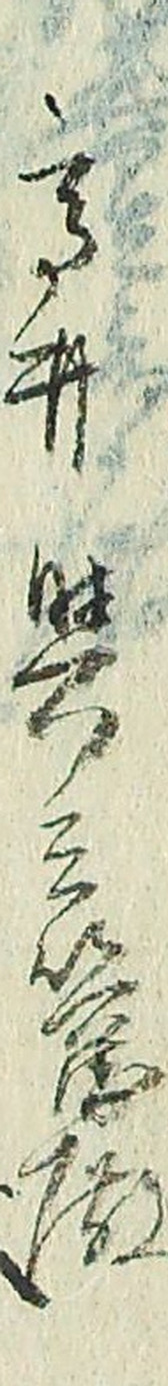高井与三兵衛殿
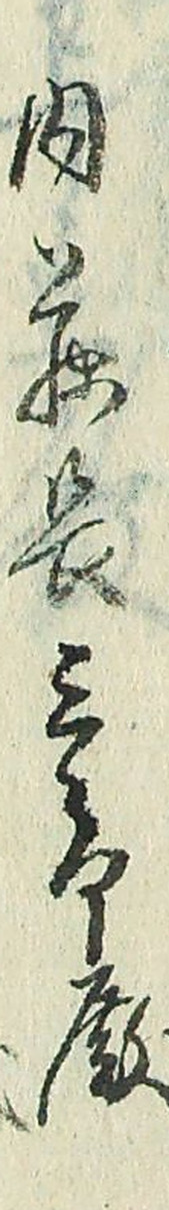内藤長三郎殿
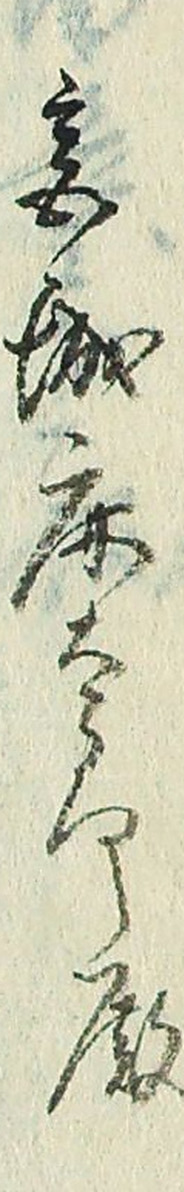宮城麻太郎殿
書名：諸御用御□受書控
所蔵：鳴門教育大学 Naruto University of Education
